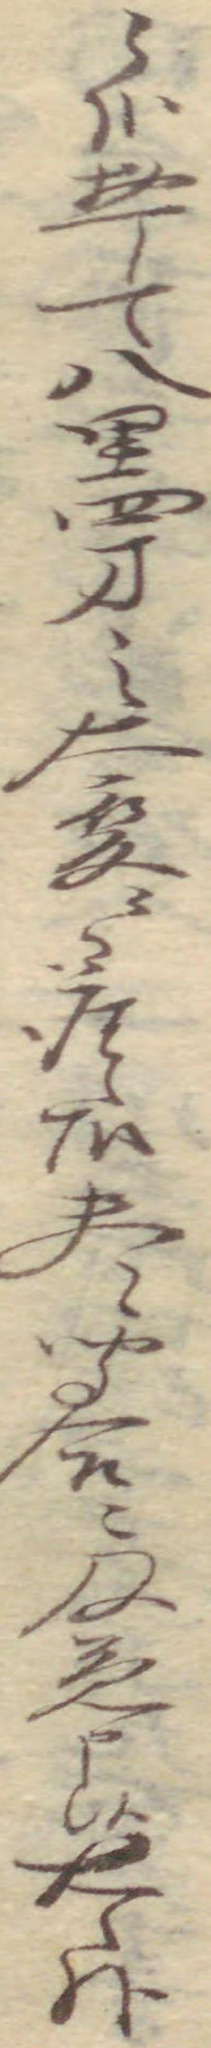候哉惣して八里四方の大変ニ御座候故夫〻聞合ニ及受申候右之外
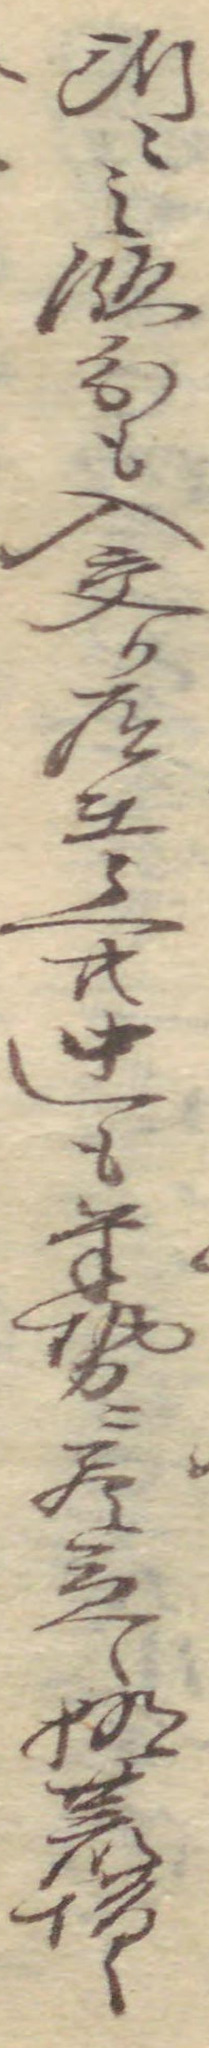所〻之領分も入交り罷在候へ共迚も筆勢ニ尽兼候極荒増し
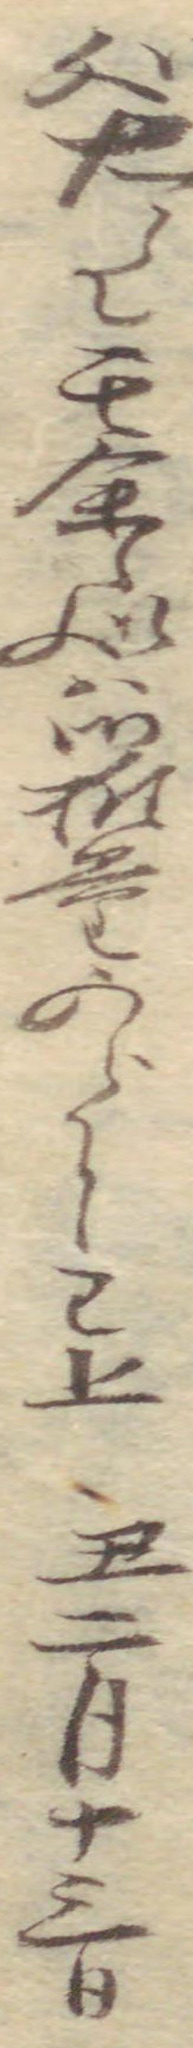処右ニて其余之処ハ御推量可被下候已上丑二月十三日
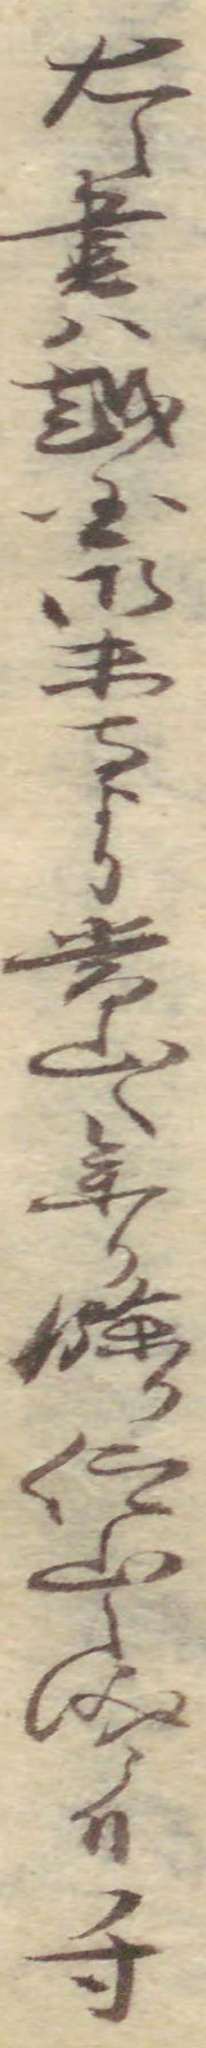右之書ハ越国御来寺より当山へ参り余り仰山之儀ニ付一寸
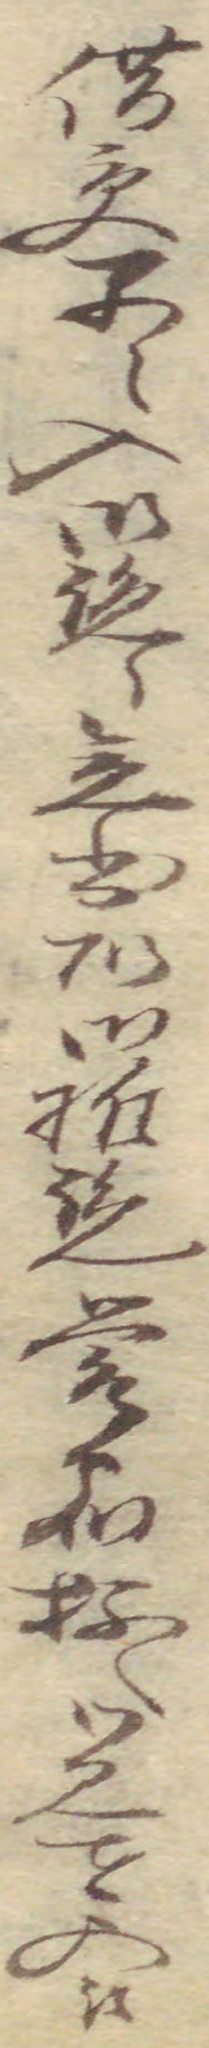借受早〻入御覧ニ急書故御推覧覚之扣抔御見せ可被
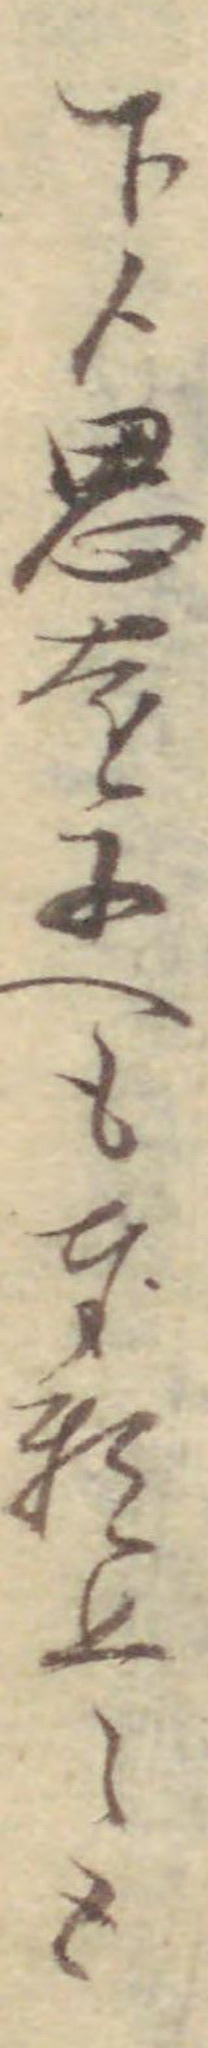下候恩遠にへも奉願上候以上
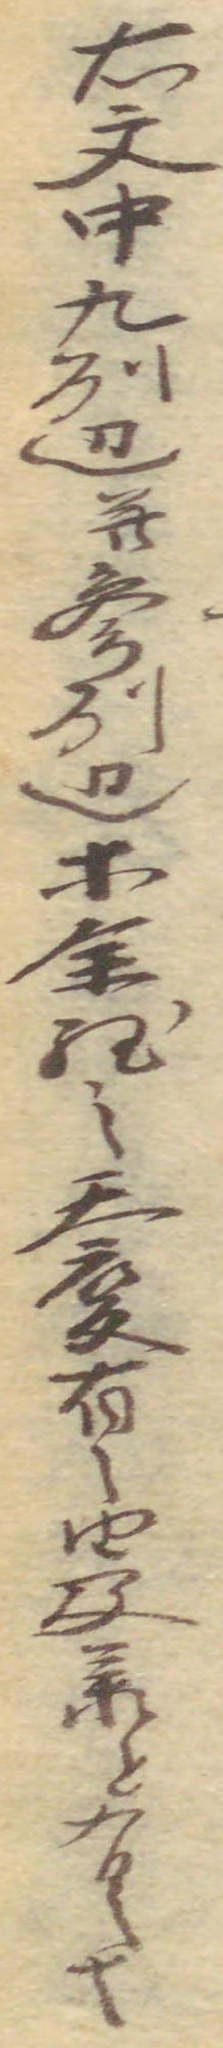右文中九州辺幷参州辺等余程之天変有之由及承と有之は

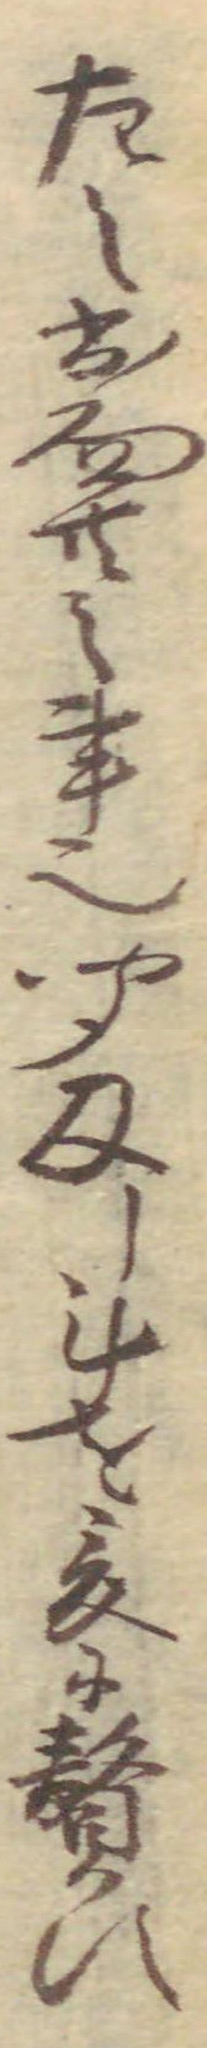左之書面共之事也聞及候斗を爰に贅す
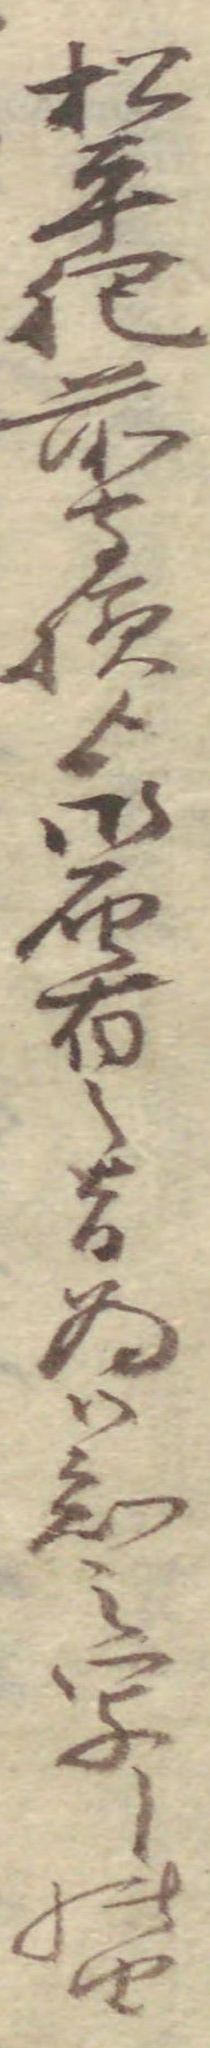松平肥前守様ゟ御届有之旨為御知之写しの由
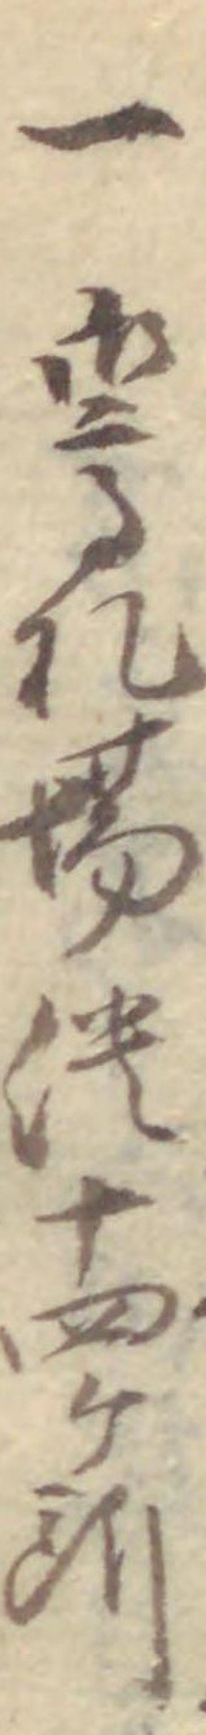一御高札場潰十四ケ所
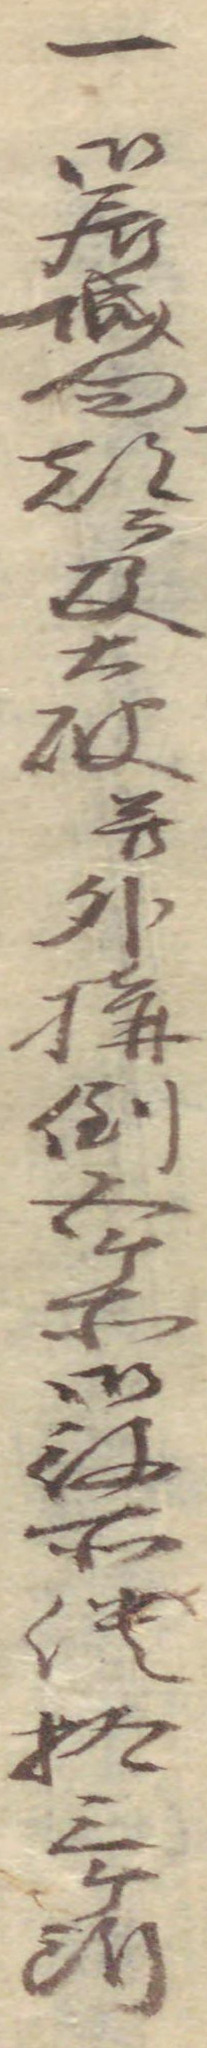一御居城向都而及大破幷外構倒五ケ所御役所潰拾三ケ所
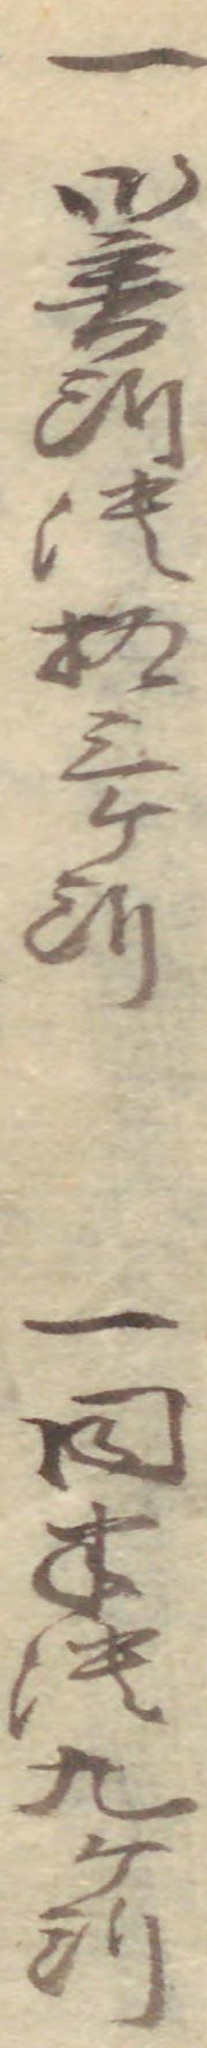一御番所潰拾三ケ所一同半潰九ケ所
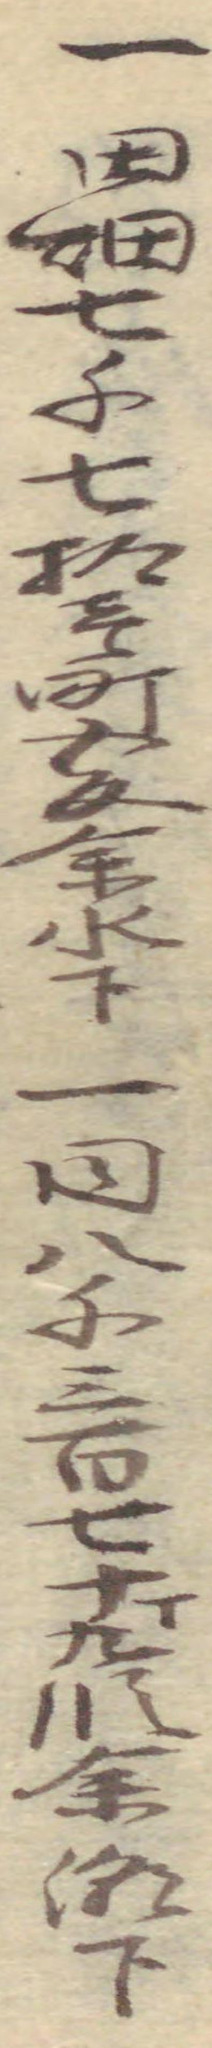一田畑七千七拾壱町五反余水下一同八千三百七十丁九段余潮下
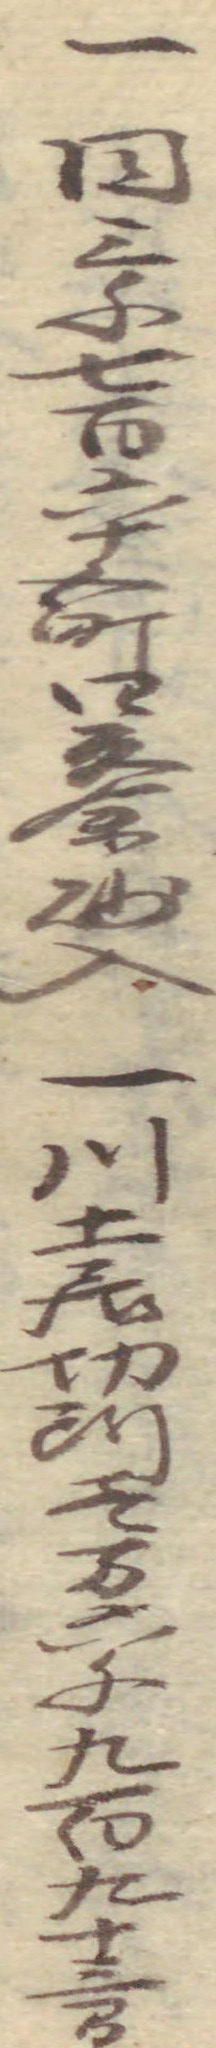一同三千七百六十五町四反余砂入一川土居切所壱万六千九百九十三間
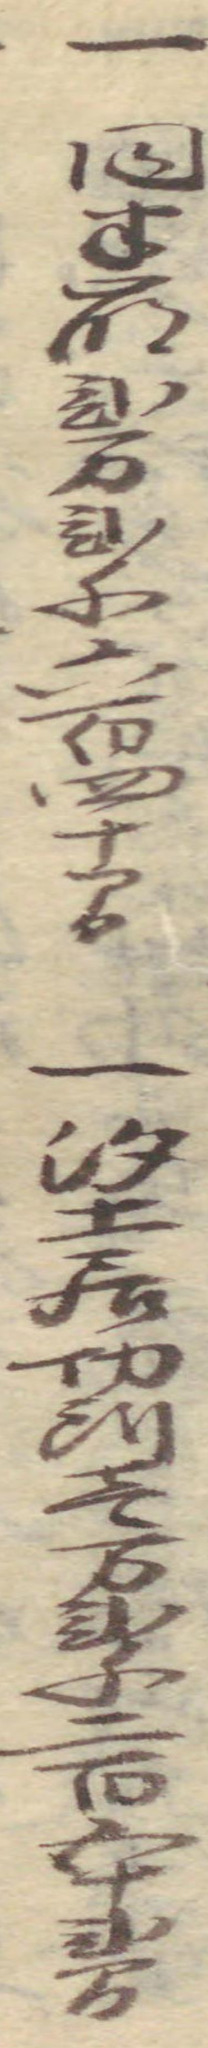一同半崩弐万弐千六百四十間一汐土居切所壱万弐千二百五十弐間
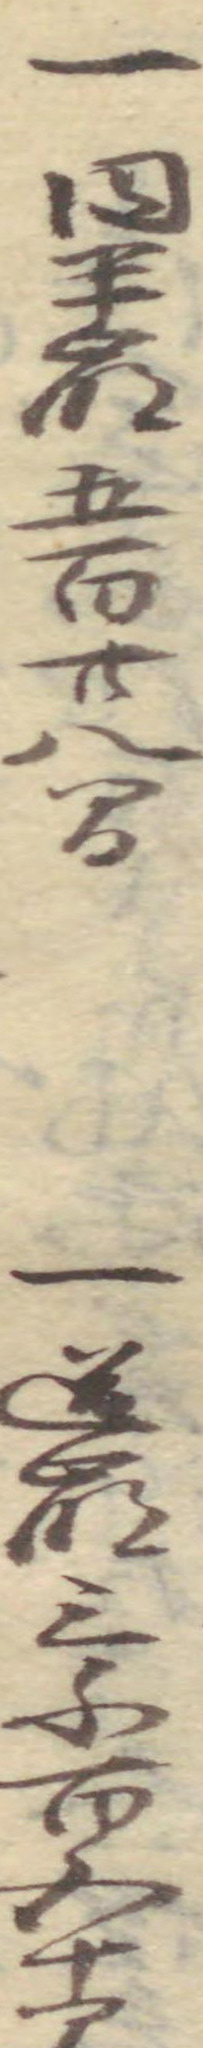一同半崩五百廿八間一道崩三千百五十間
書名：鶯宿雑記. 巻199-200
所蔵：国立国会図書館 National Diet Library, JAPAN
